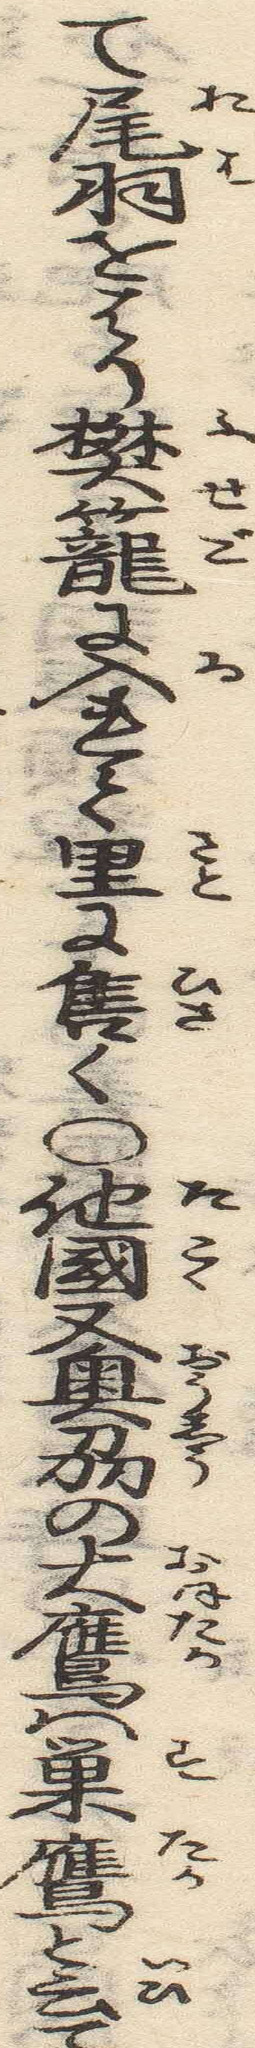て尾羽をはり樊籠に入れて里に售く○他国又奥州の大鷹は巣鷹と云て
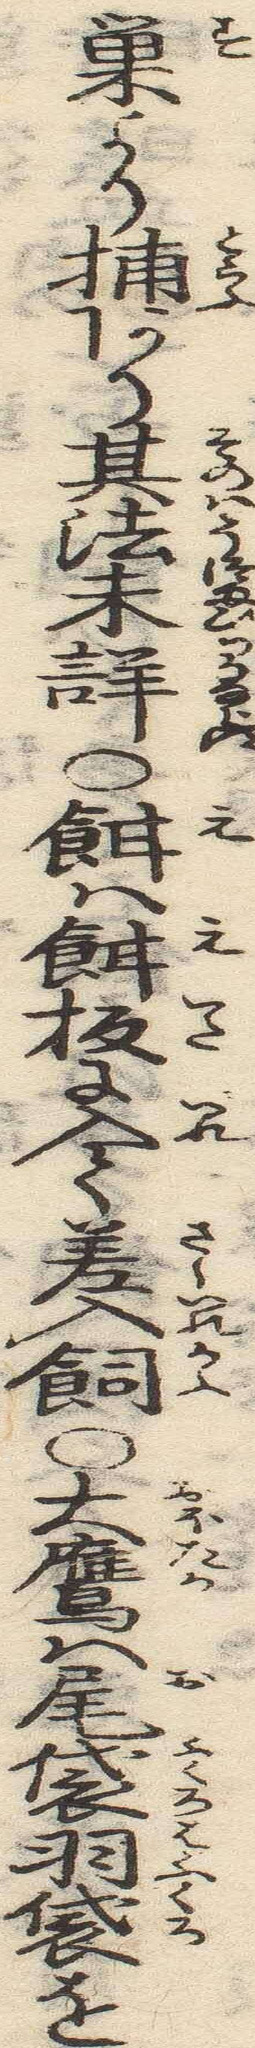巣より捕あり其法未詳○餌は餌板に入て差入飼○大鷹は尾袋羽袋を
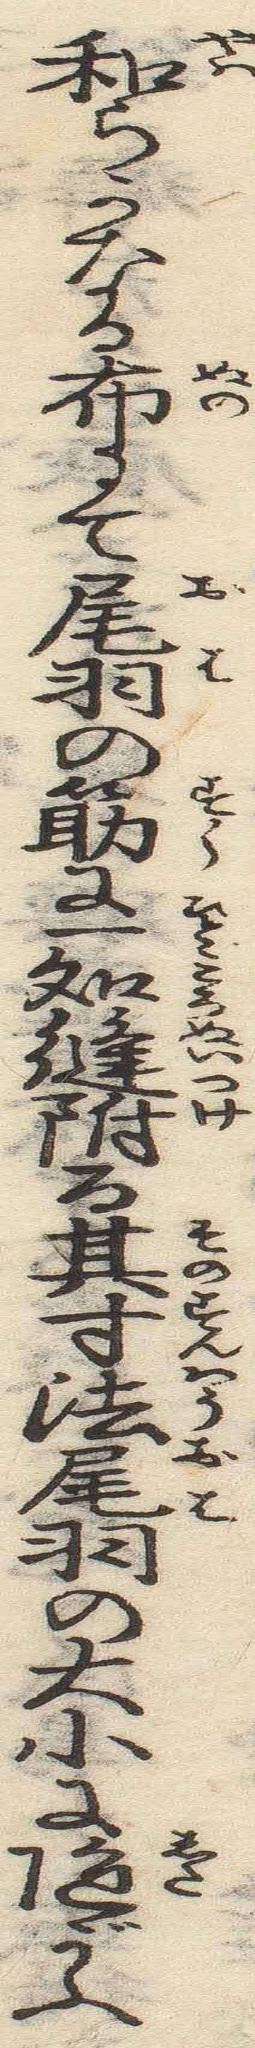和らかなる布にて尾羽の筋に一処縫付る其寸法尾羽の大小に随がふ
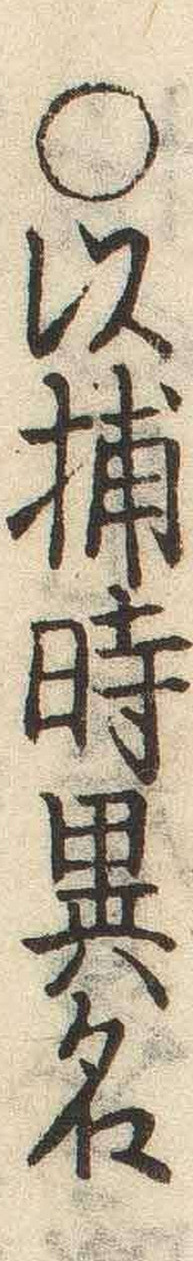○以捕時異名
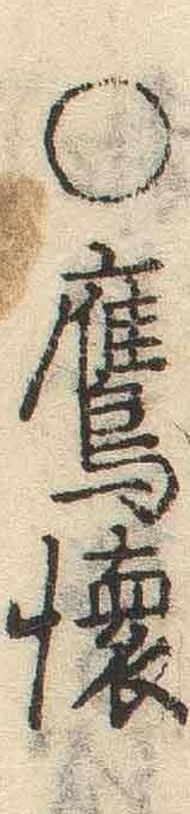○鷹懐
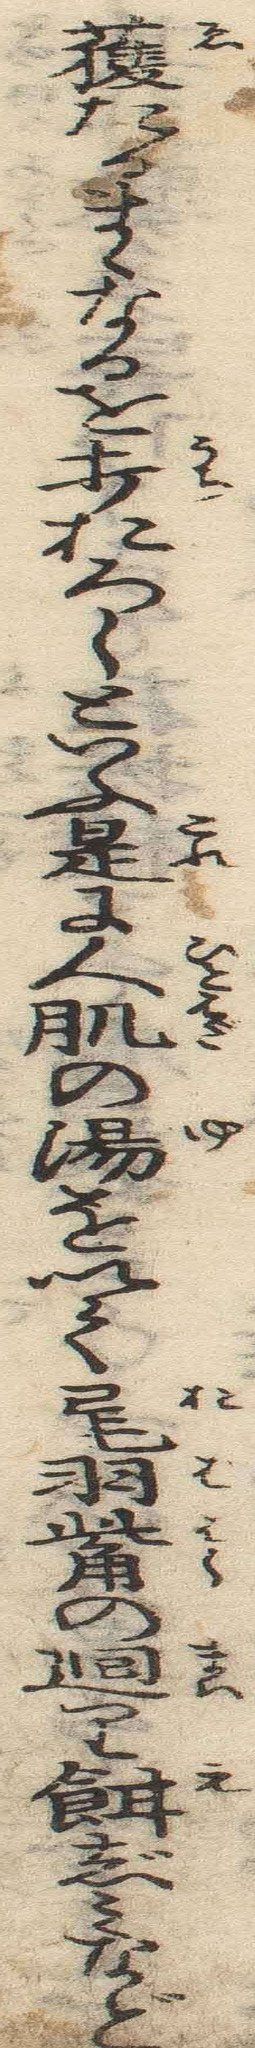獲たるまゝなるを打おろしといふ是に人肌の湯を以て尾羽觜の廻り餌じみなど
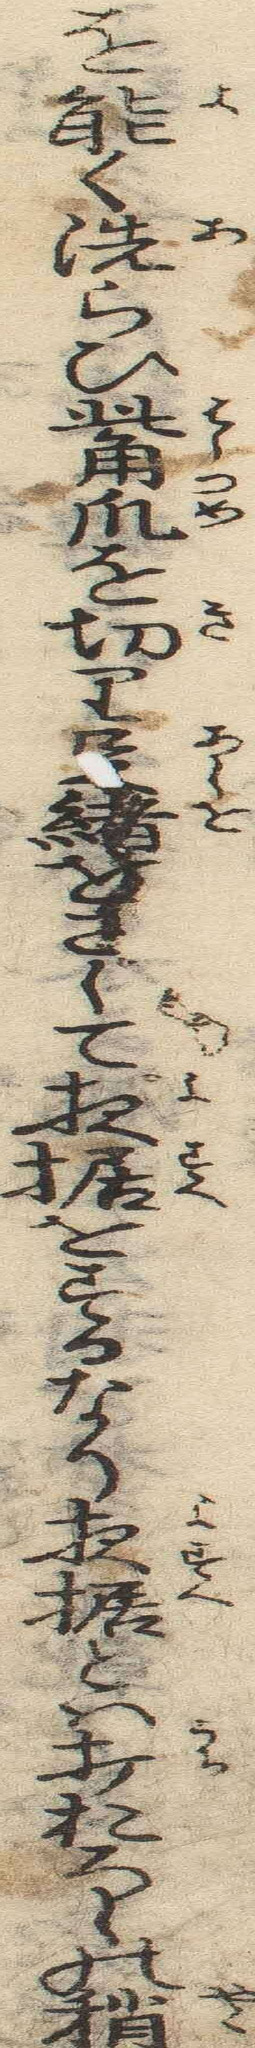を能く洗らひ觜爪を切り足緒をさして夜据をするなり夜据とは打おろしの稍
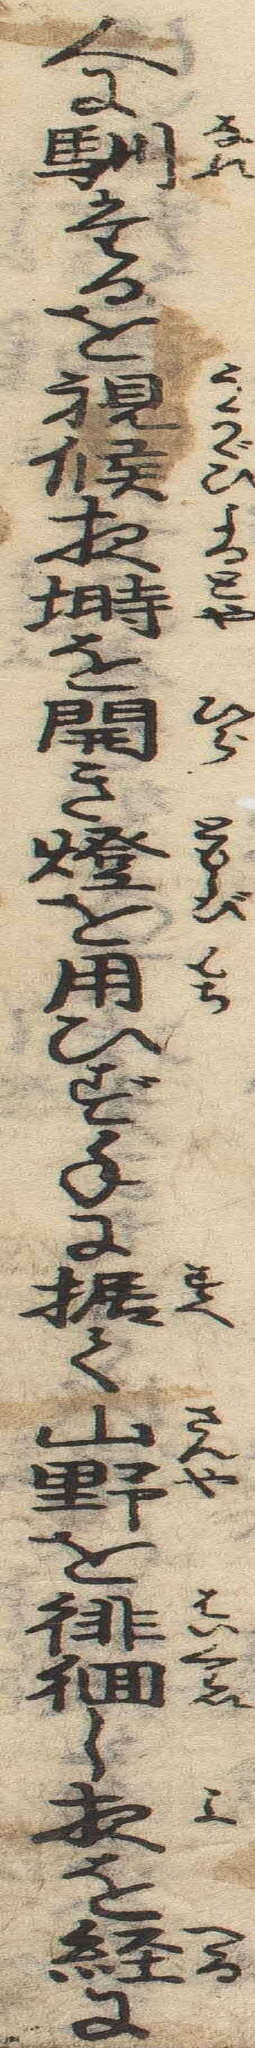人に馴たるを視候夜塒を開き燈を用ひず手に据て山野を徘徊し夜を経に

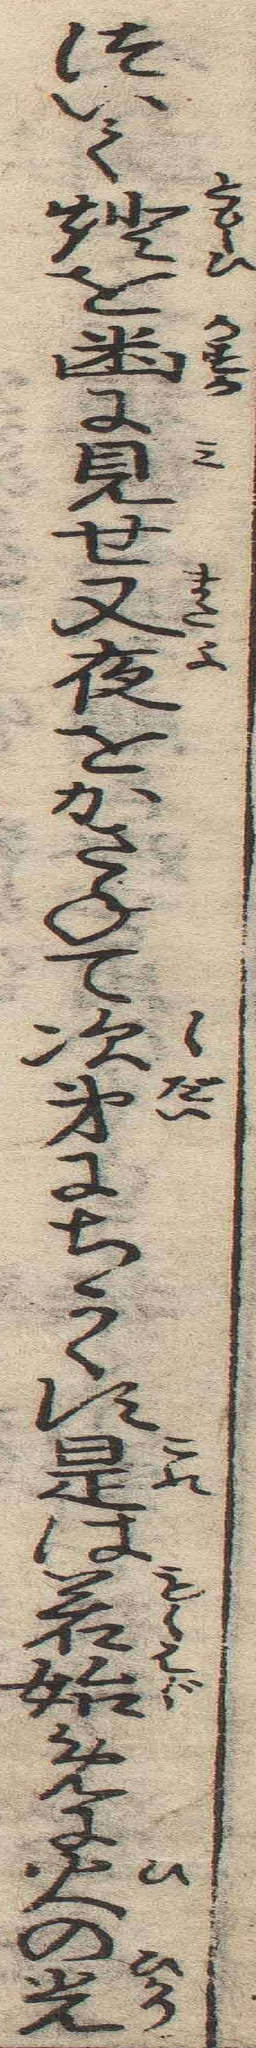ついて燈を幽に見せ又夜をかさねて次第にちかくす是は若始めに火の光
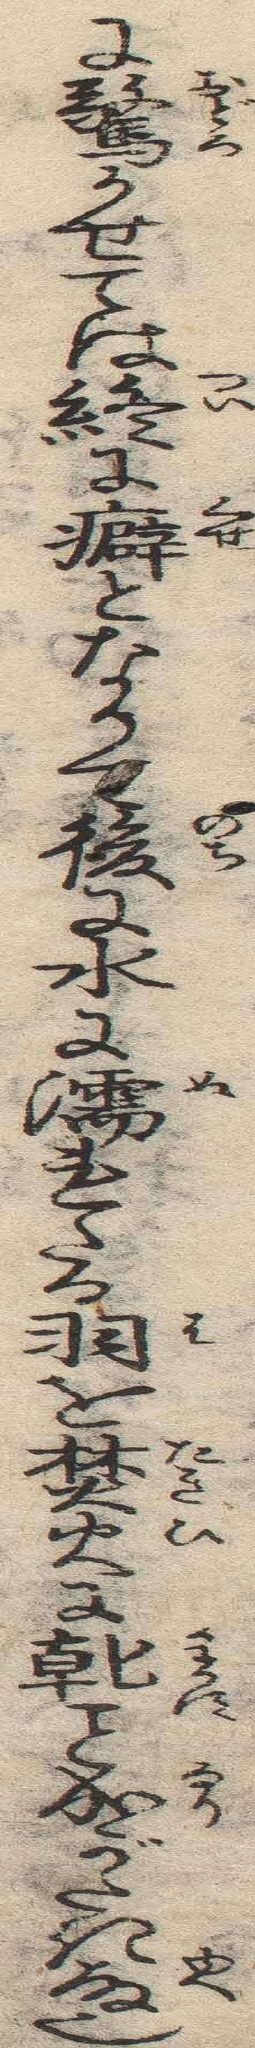に驚かせては終に癖となりて後に水に濡れたる羽を焚火に乾こと成がたき故也
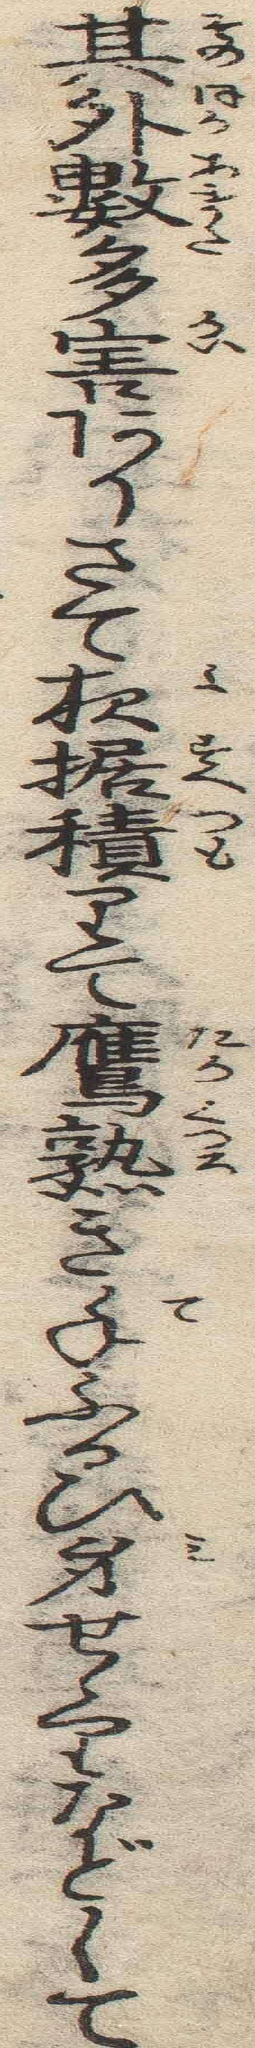其外数多害ありさて夜据積りて鷹熟ぎ手ふるひ身せゝりなどして
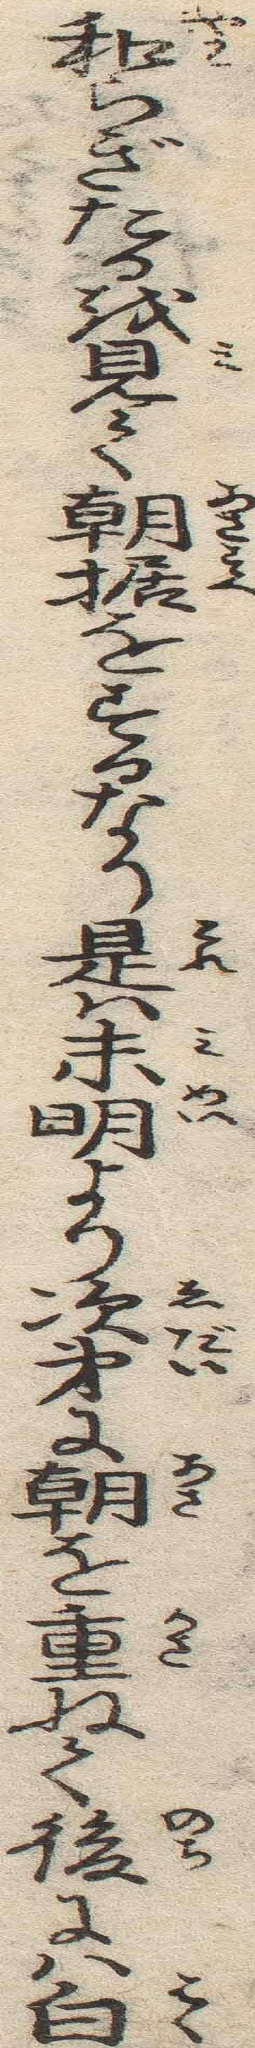和らぎたるを見て朝据をするなり是は未明より次第に朝を重ねて後には白
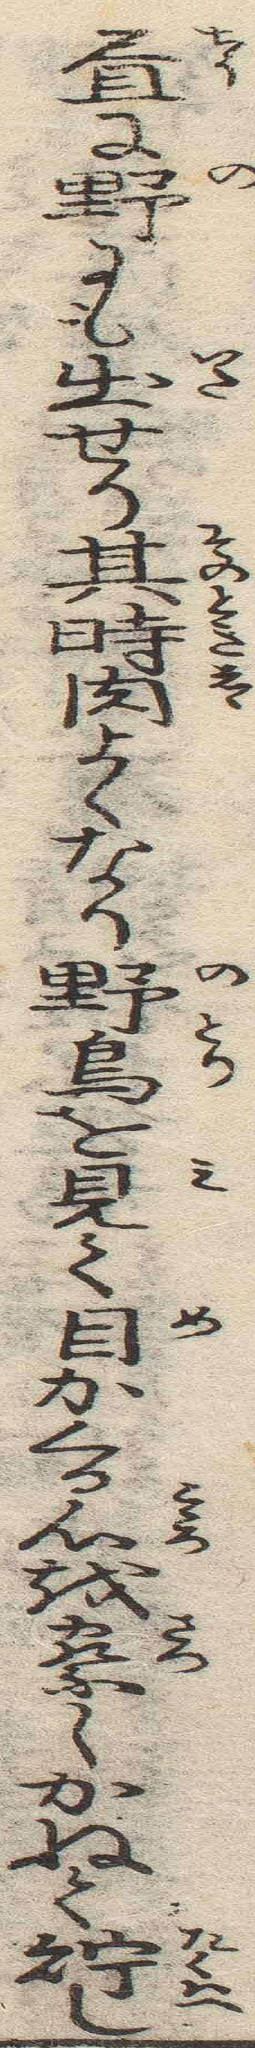昼に野にも出せり其時肉よくなり野鳥を見て目かくる心を察しかねて貯し
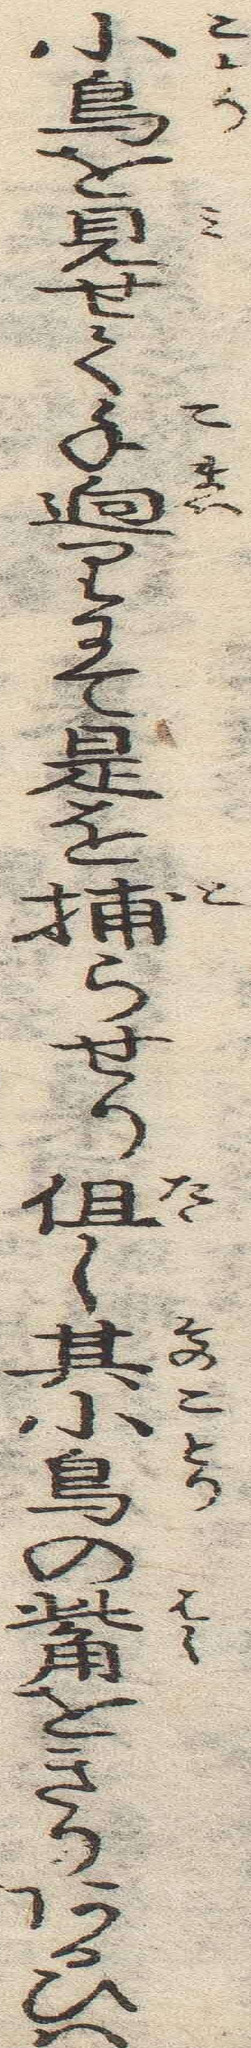小鳥を見せて手廻りにて是を捕らせり但し其小鳥の觜をきりあるひは
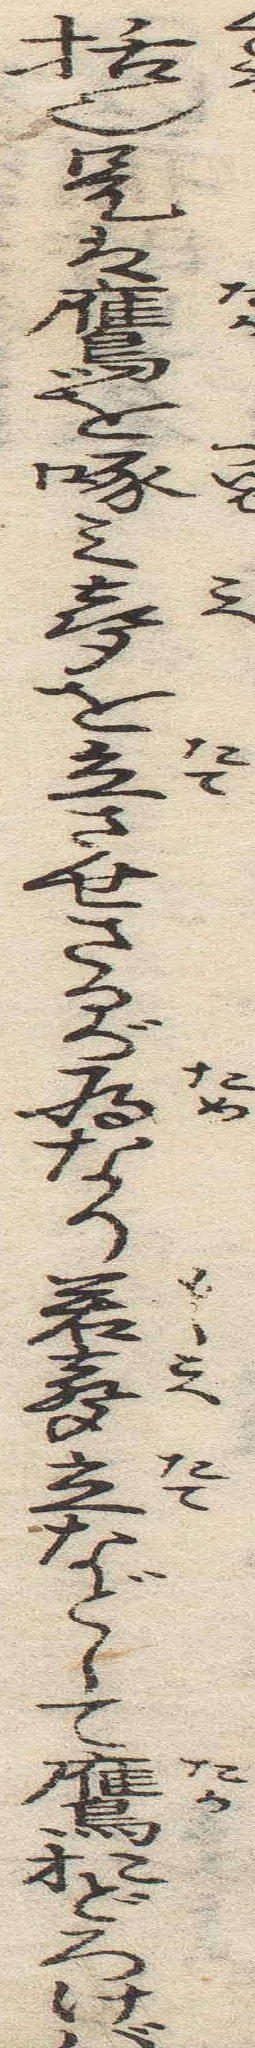括也是は鷹を啄み声を立させさるが為なり若声立などして鷹おどろけば
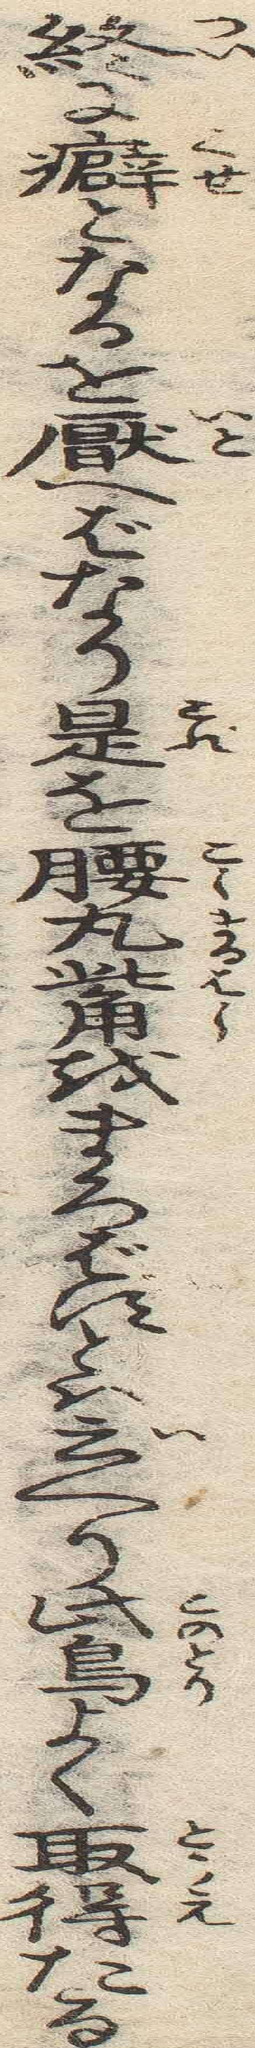終に癖となるを厭へばなり是を腰丸觜をまろばすとは云へり此鳥よく取得たる
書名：日本山海名産図会
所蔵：東京学芸大学附属図書館 国文学研究資料館
